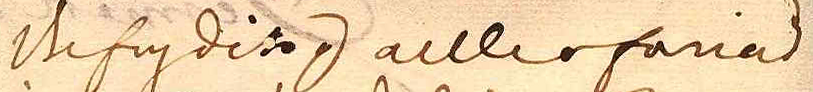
lhe foy dito q̄ a elle o fariaõ
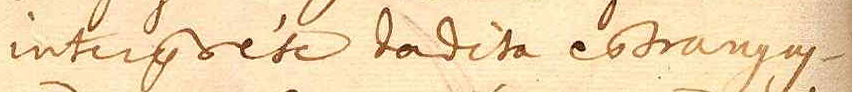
interprete da dita estrangey
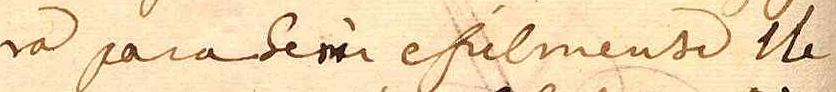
ra para bemm e fielmente lhe
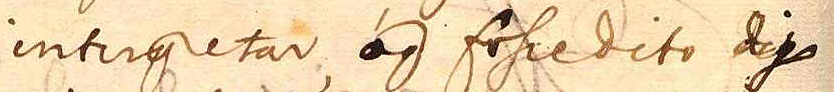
interpretar o q̄ fosse dito digo
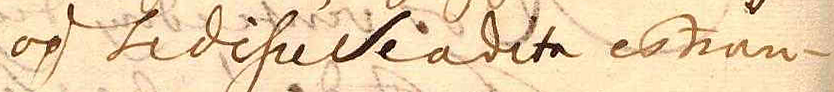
o q̄ se disse se a dita estran
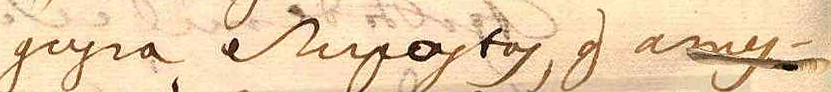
geyra, e Respostas, q̄ a mes
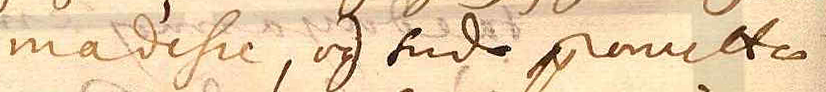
ma disse, o q̄ tudo prometteo
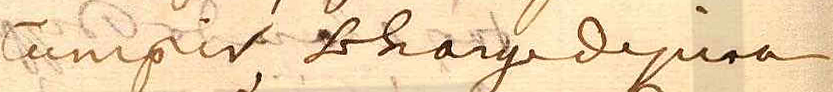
cumprir sobcargo de jura
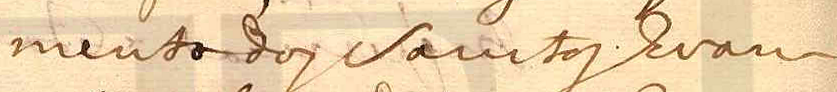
mento dos Santos evan
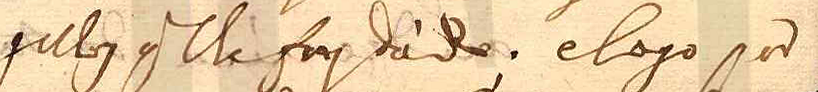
gelhos q̄ lhe foy dádo; e logo per
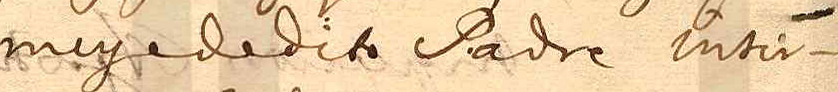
meyo do dito Padre inter
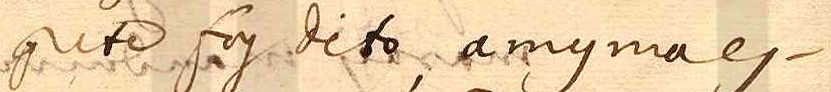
prete foy dito a mesma es
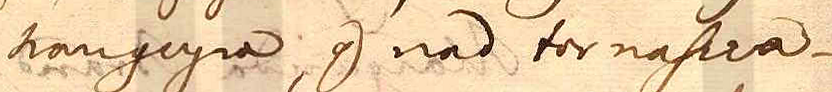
trangeyra, q̄ naõ tornasse a
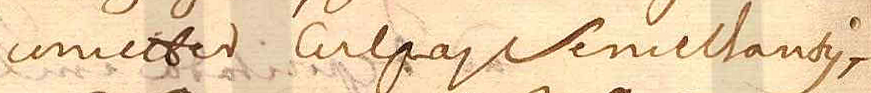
cometter culpas Semelhantes
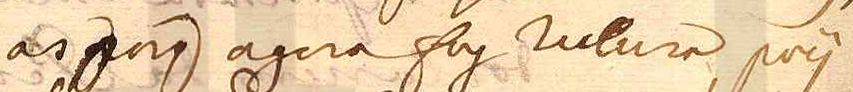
as porq̄ agora foy Recluza, porq̄
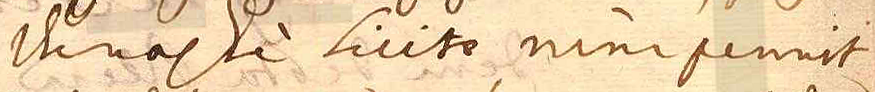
lhe naõ hé licito nem permit
